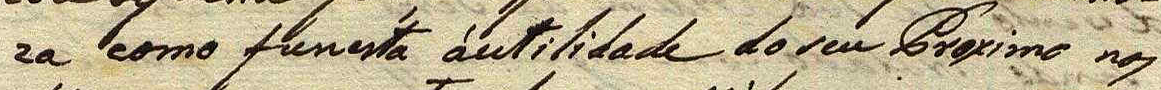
za como funesta á utilidade do seu Proximo nos
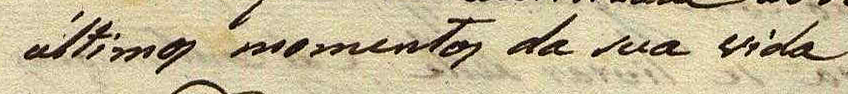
últimos momentos da sua vida
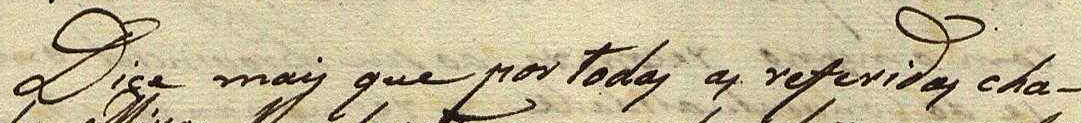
Dice mais que por todas as referidas cha
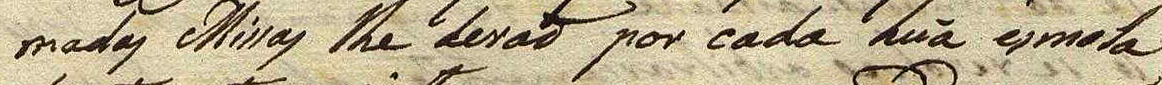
madas Missas lhe deraõ por cada huā esmola
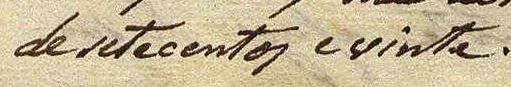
de setecentos e vinte.
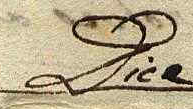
Dice
